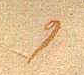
9
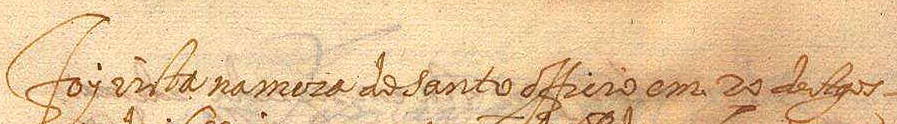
foy vista na meza do santo officio em 20 de Agos
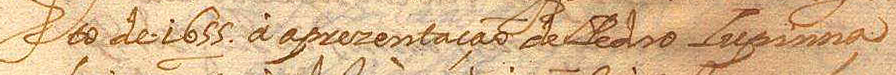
to de i655. a aprezentaçaõ de Pedro Lupinna
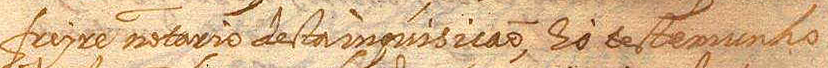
freyre notario desta inquisiçaõ, E o testemunho
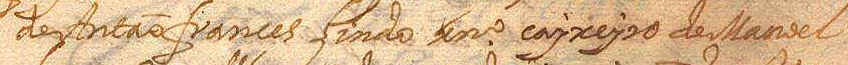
de Antaõ frances Lindo xn.o cayxeyro de Manoel
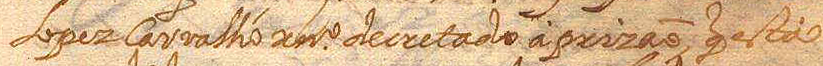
Lopez Carvalho xn.o decretado à prizaõ, q̄ está
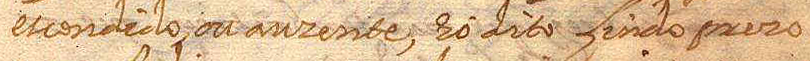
escondido, ou auzente, E o dito Lindo prezo
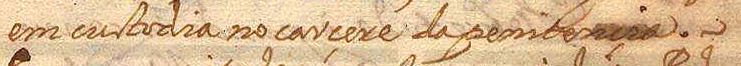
em custodia no carcere da penitencia.
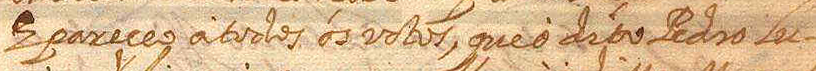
E pareceo a todos os votos, que o dito Pedro lu
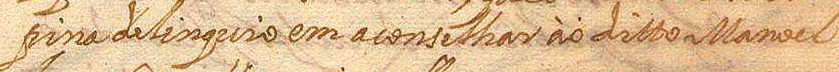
pina delinquio em aconselhar ao ditto Manoel
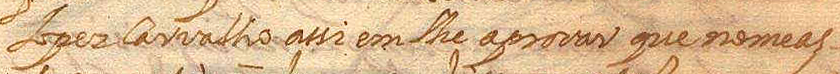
Lopez Carvalho assi em lhe aprovar que nomeas
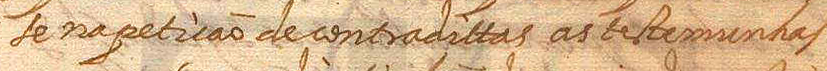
se na petiçaõ de contradittas as testemunhas
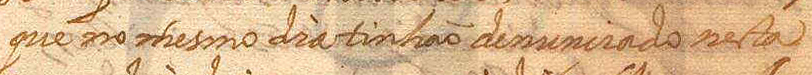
que no mesmo dia tinhaõ denunciado nesta
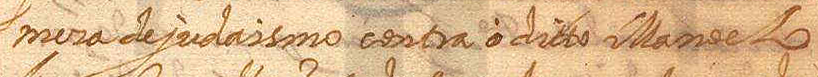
meza de judaismo contra o ditto ManoeL
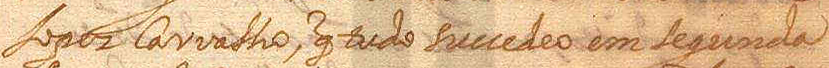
Lopez Carvalho, q̄ tudo succedeo em segunda
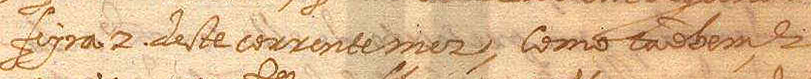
feyra deste corrente mez, como taõbem, E
